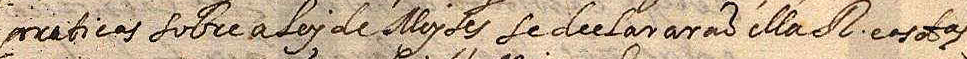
praticas sobre a Ley de Moyses se declararaõ ella R. e as d̄as
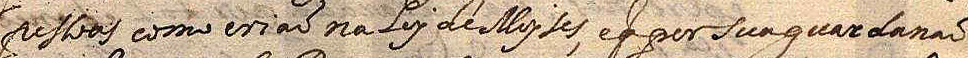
pessoas como criaõ na Ley de Moyses, e q̄ por sua guarda naõ
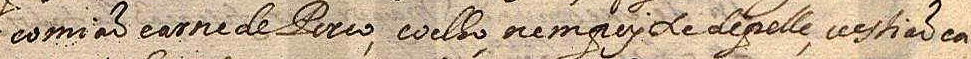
comiaõ carne de Porco, coelho, nem peyxe de pelle, uestiaõ ca
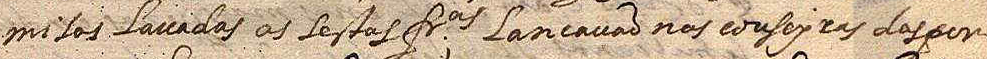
misas Lauadas as sestas fr.as, Lancauaõ nas couseyras das por
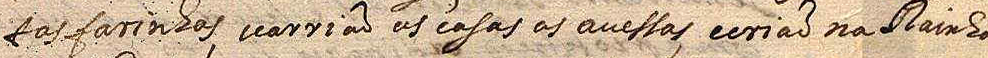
tas farinhas, uarriaõ as casas as auessas, e criaõ na Rainha
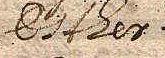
Esther.
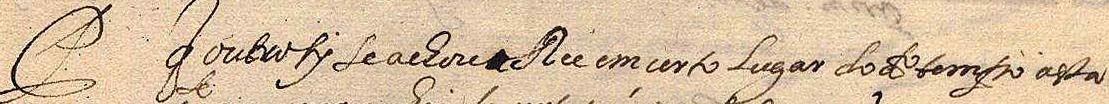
P q̄ outrosy se achou a Ree em çerto Lugar do d̄o tempo a esta
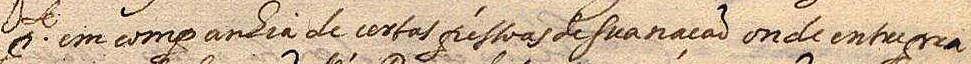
pte. em companhia de çertas pessoas de sua naçaõ onde entre pra
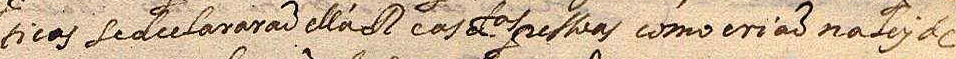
ticas se declararaõ ella R e as d̄as pessoas como criaõ na Ley de
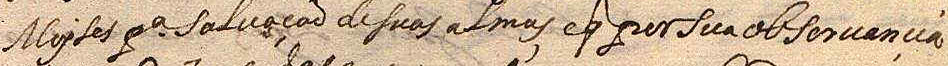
Moyses pa. saluaçaõ de suas aLmas, e q̄ por sua obseruançia
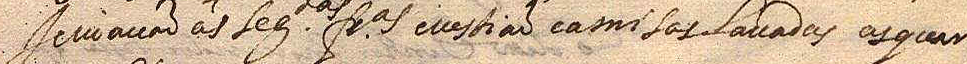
Jeiuauaõ âs seg.das fr.as e uestiaõ camisas Lauadas as quar
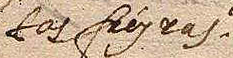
tas freyras.
